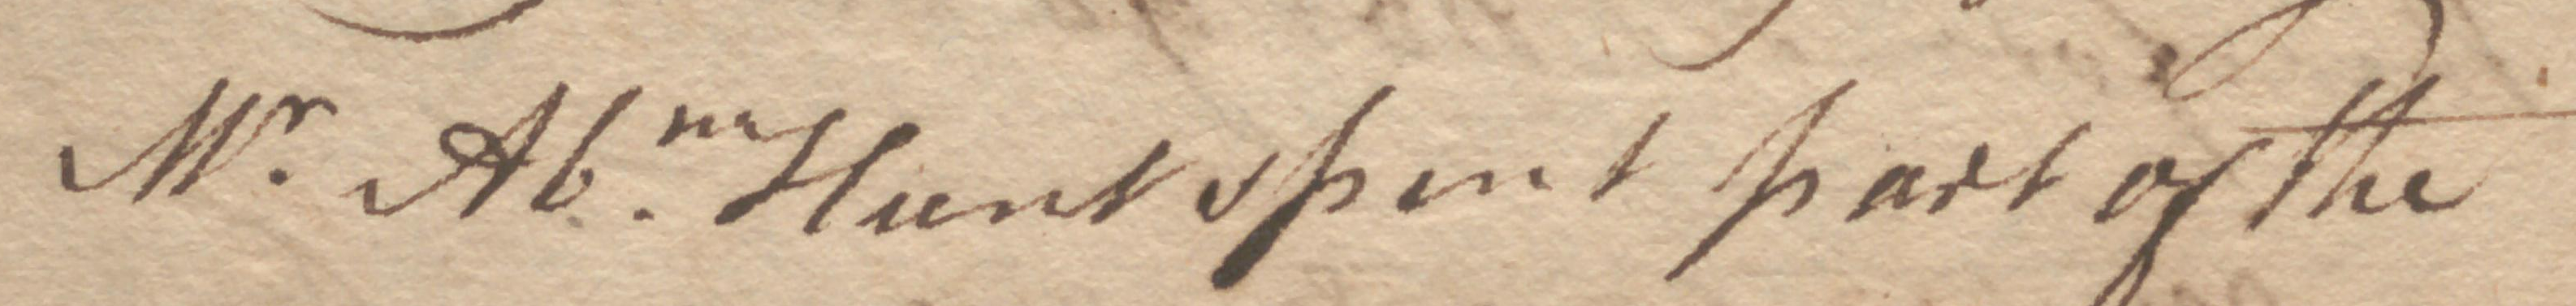M^r. Ab^m. Hunt spent part of the
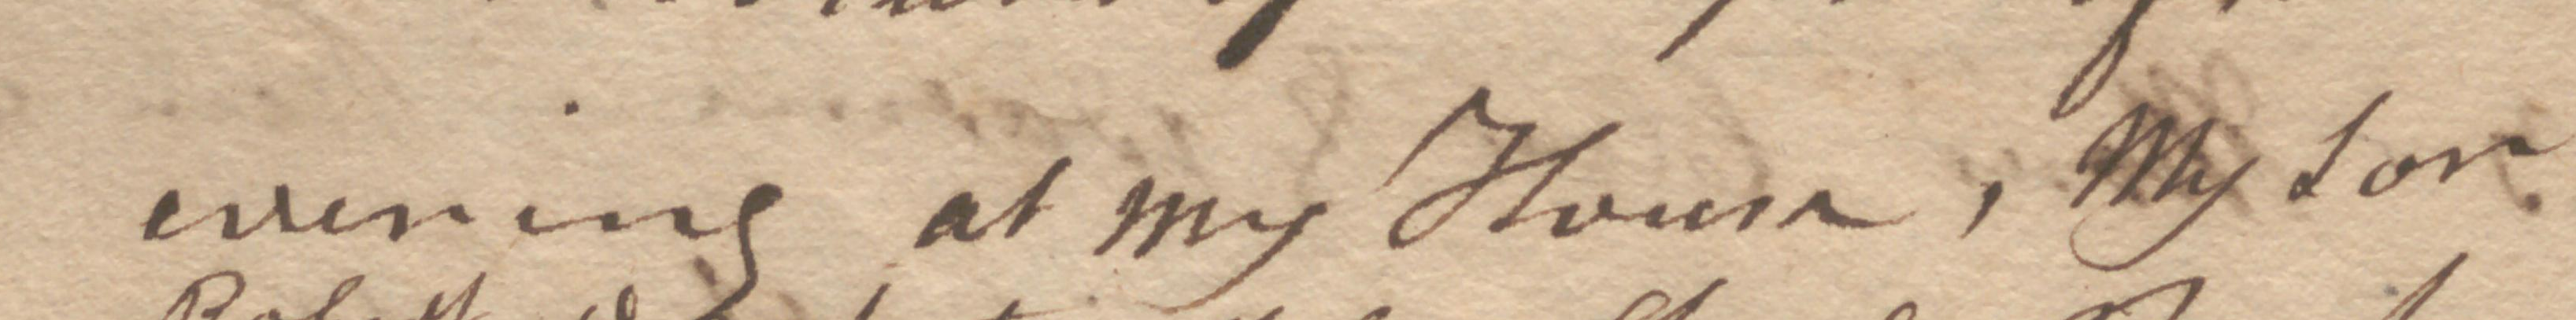evening at my House, My Son
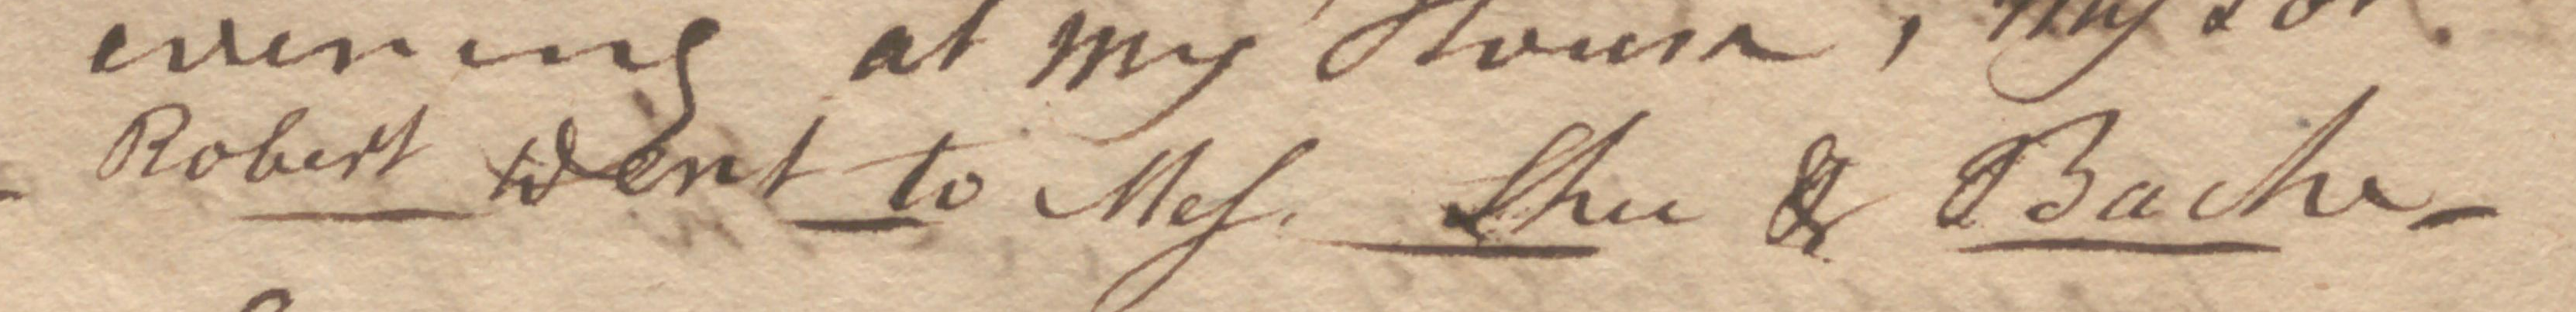Robert went to Mes. Shee & Bache
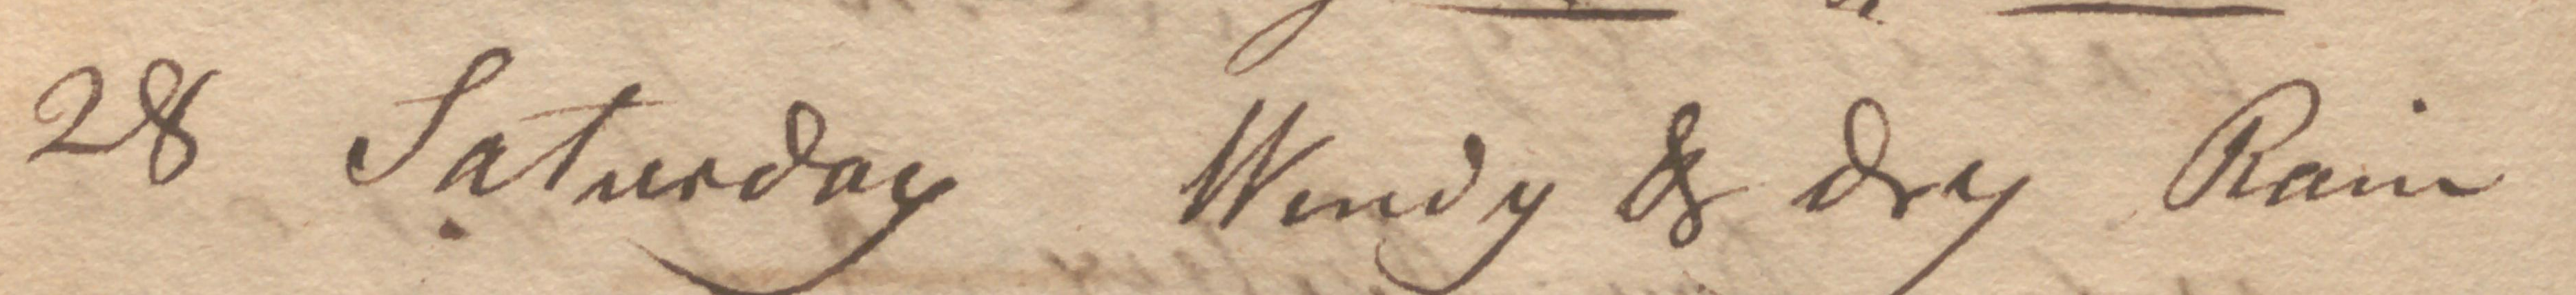28 Saturday Windy & dry Rain
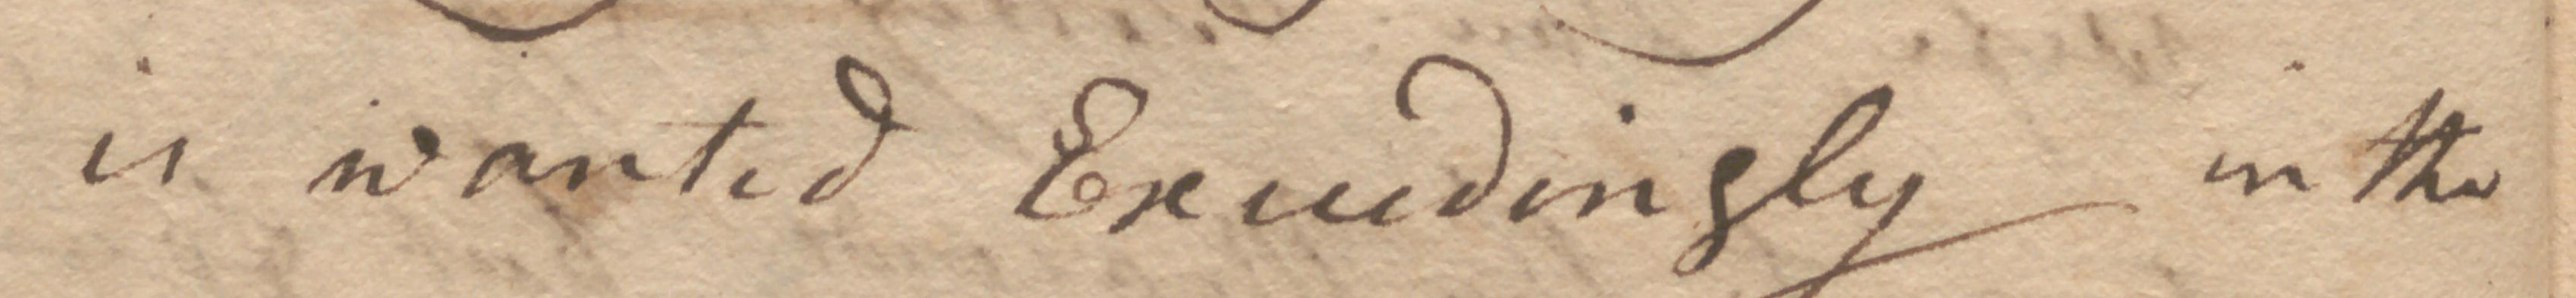is wanted Exceedingly in the
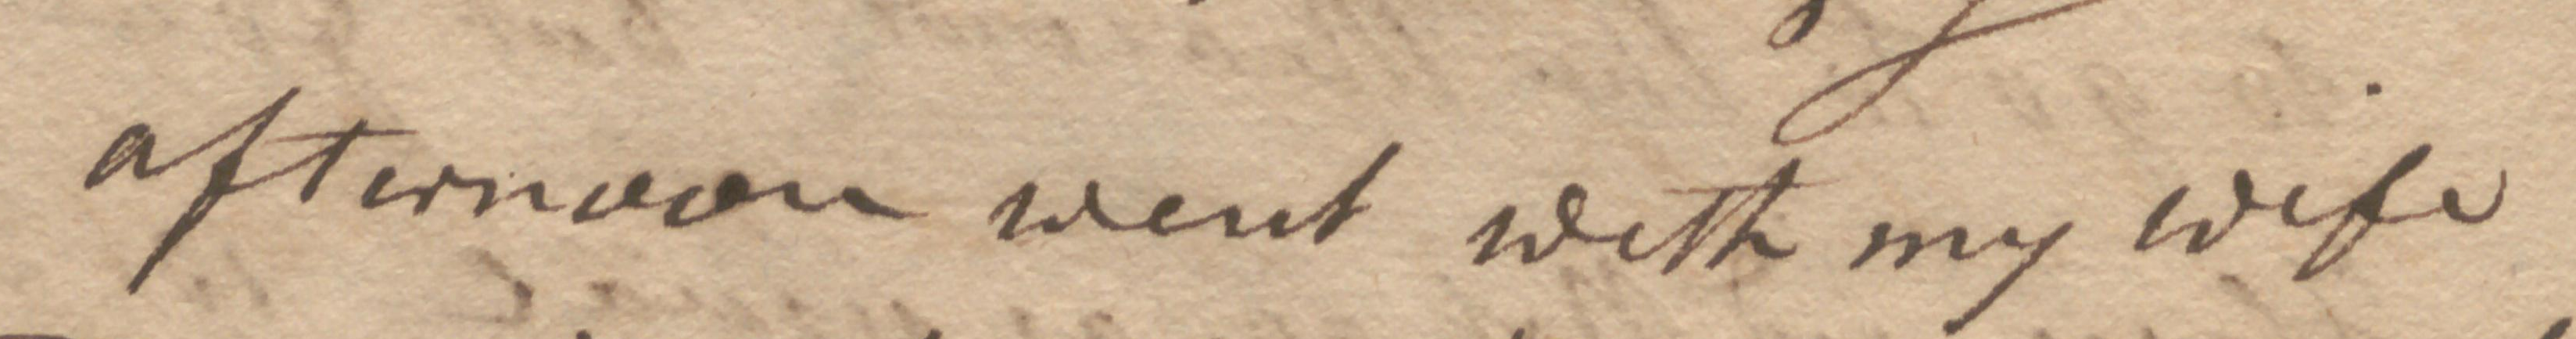afternoon went with my wife
